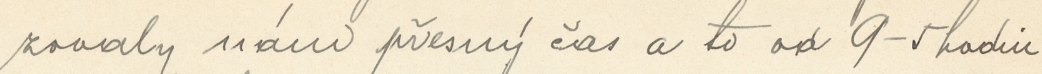zovaly nám přesný čas a to od 9-5 hodin.
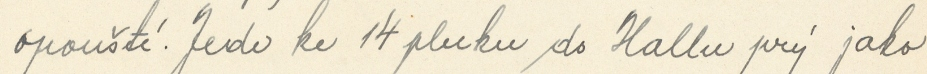opouští. Jede ke 14 pluku do Hallu prý jako
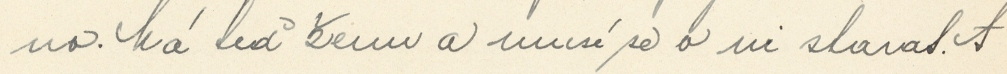no. Má teď ženu a musí se o ni starat. A
